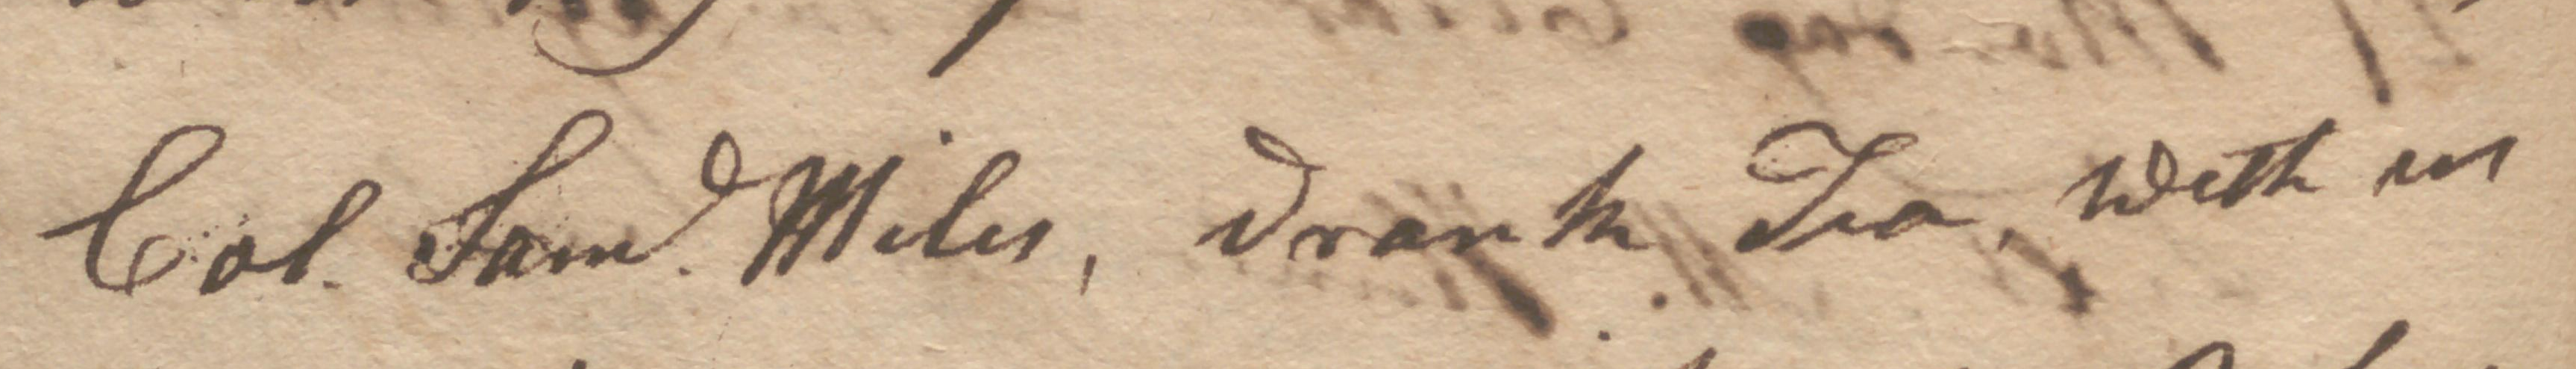Col Sam^l. Miles, drank Tea, wish us
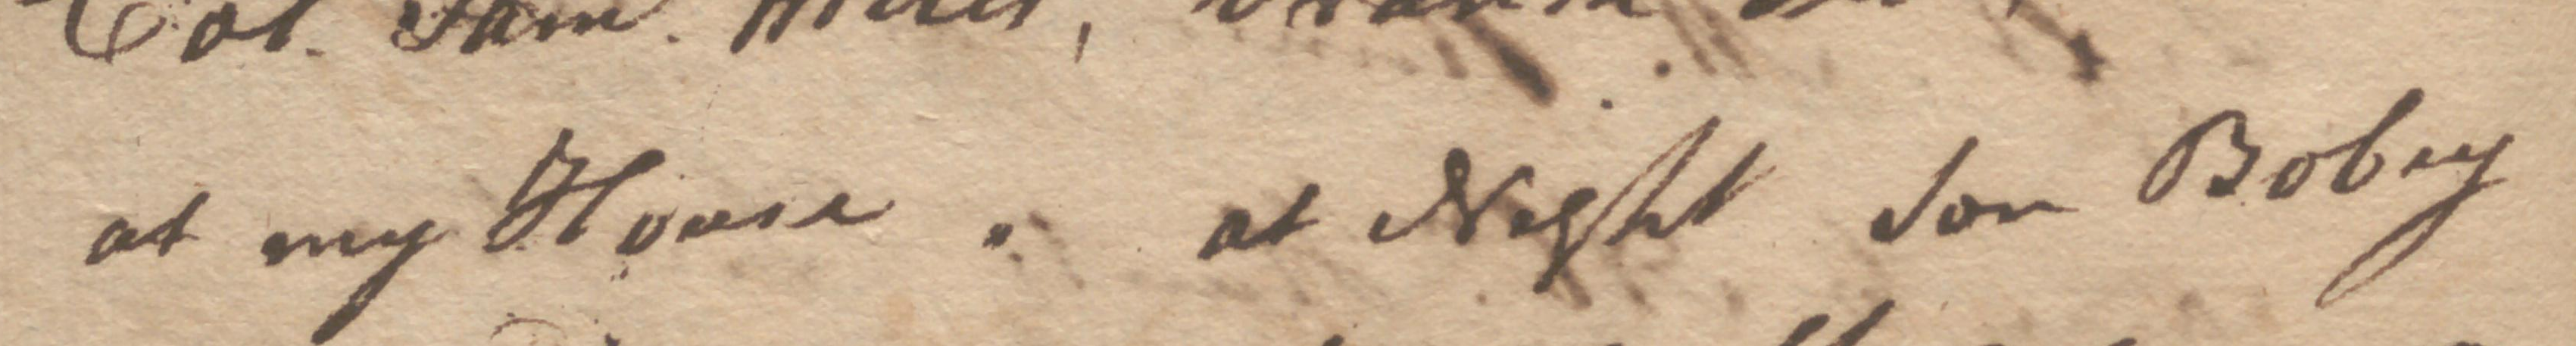at my House. at Night Son Bobey
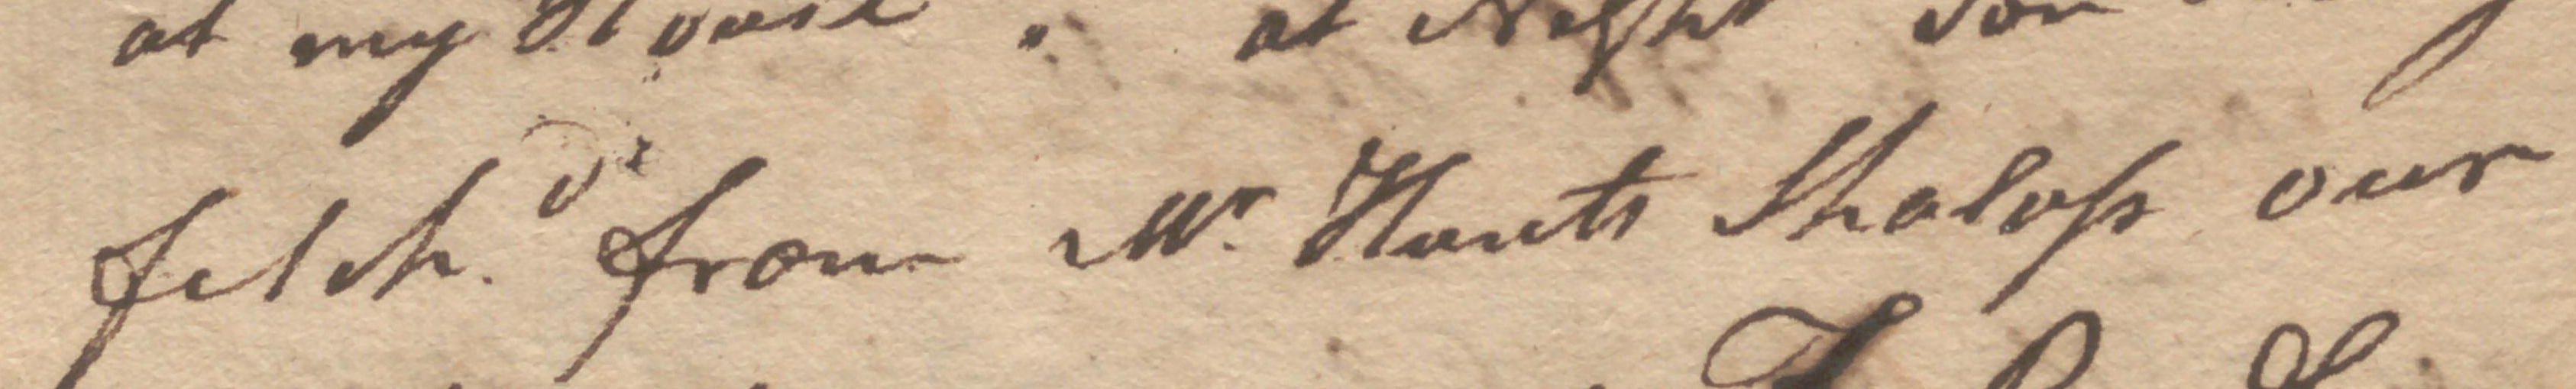fetch^d. from M^r. Hunts Shalop our
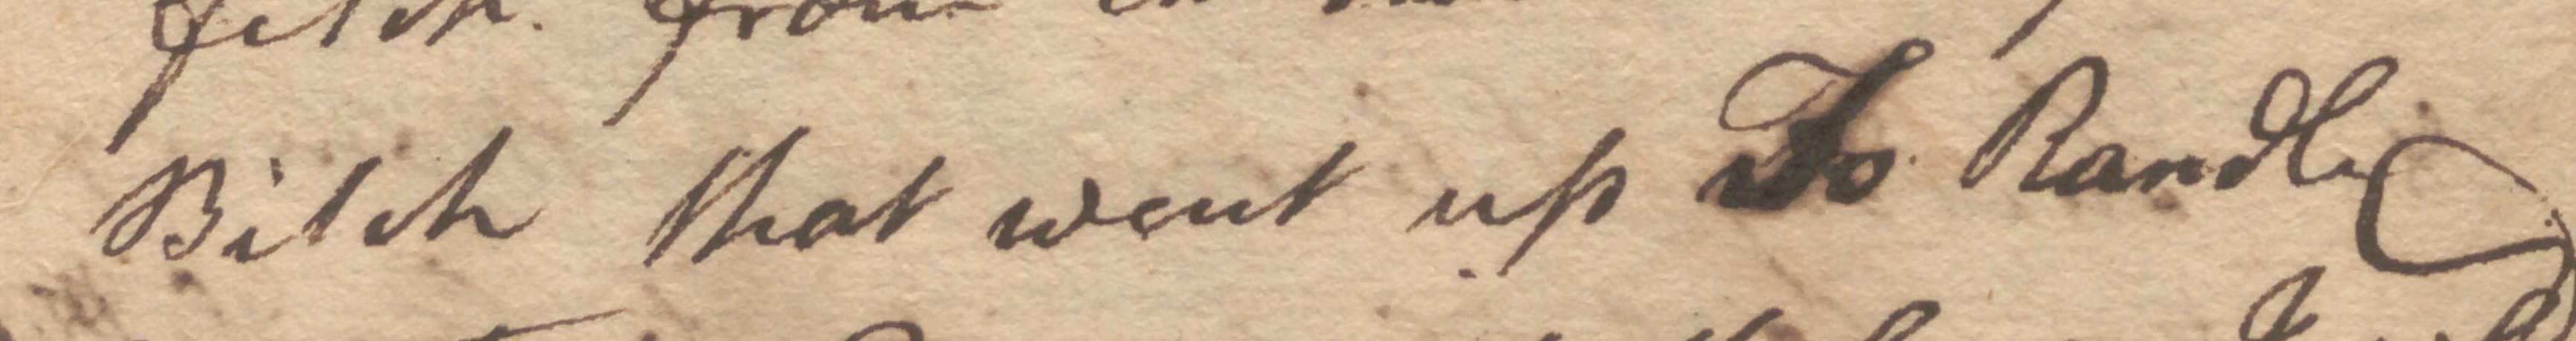Bitch that went up To Randle
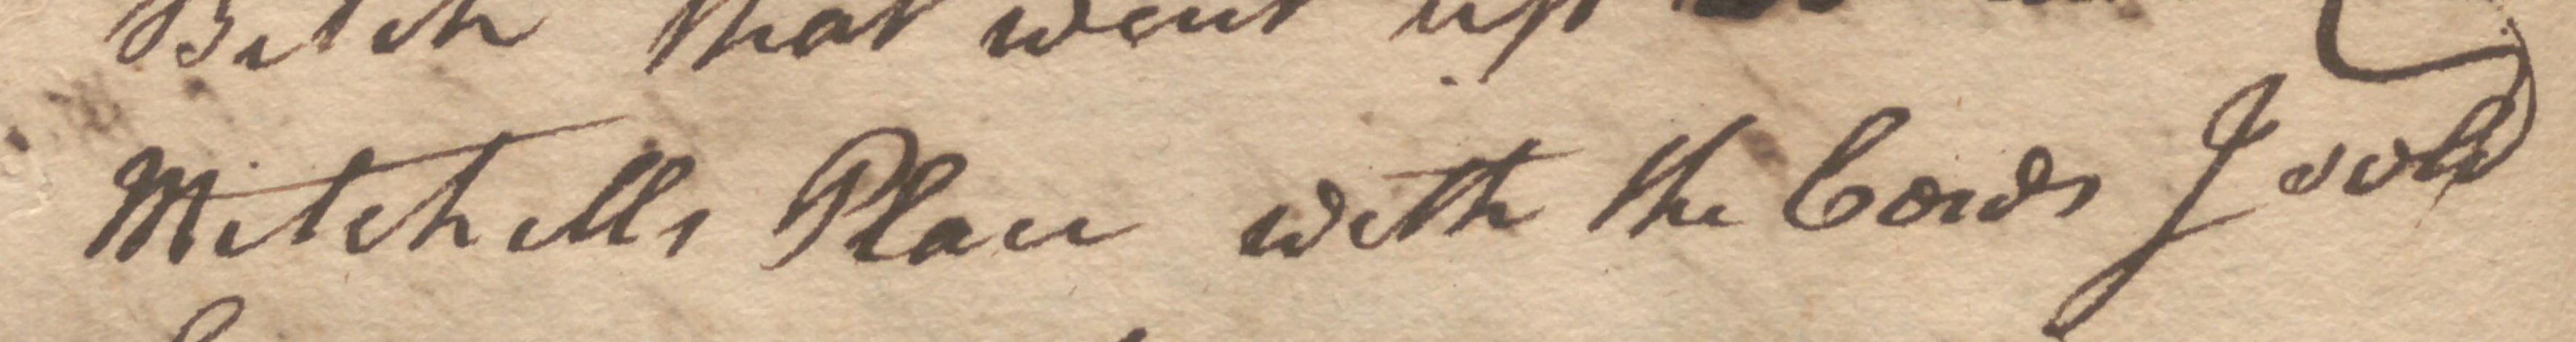Mitchells Place with the Cows I sold
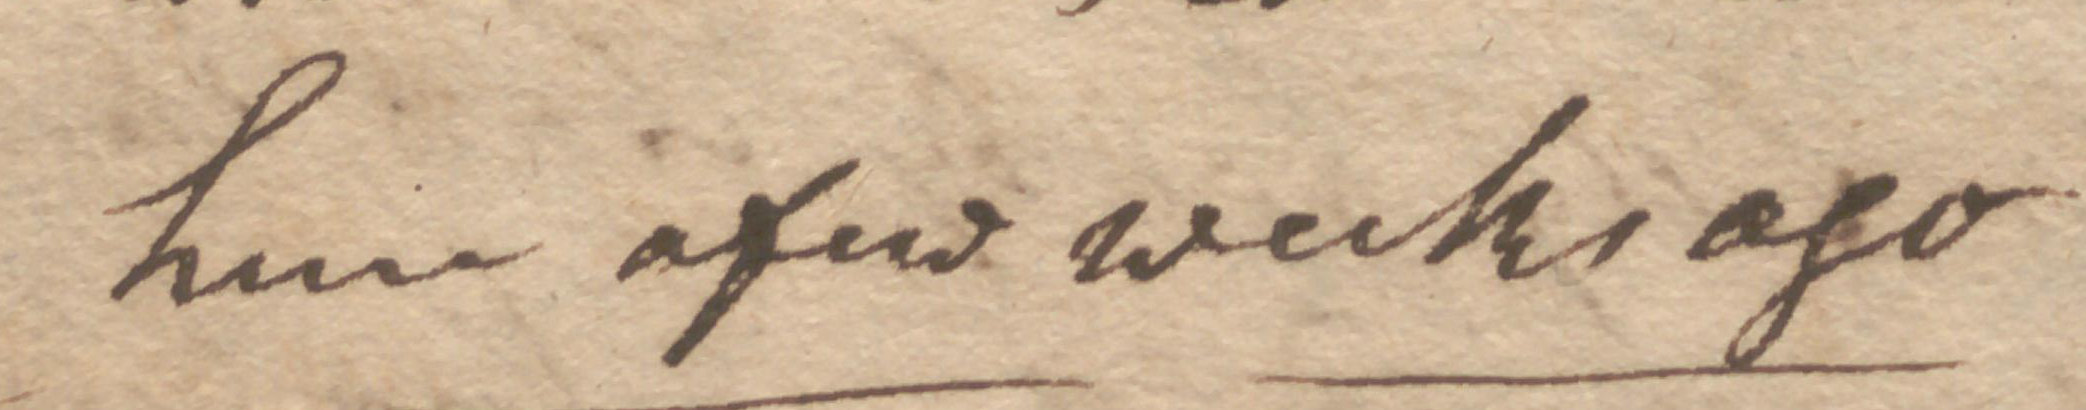him afew weeks ago
